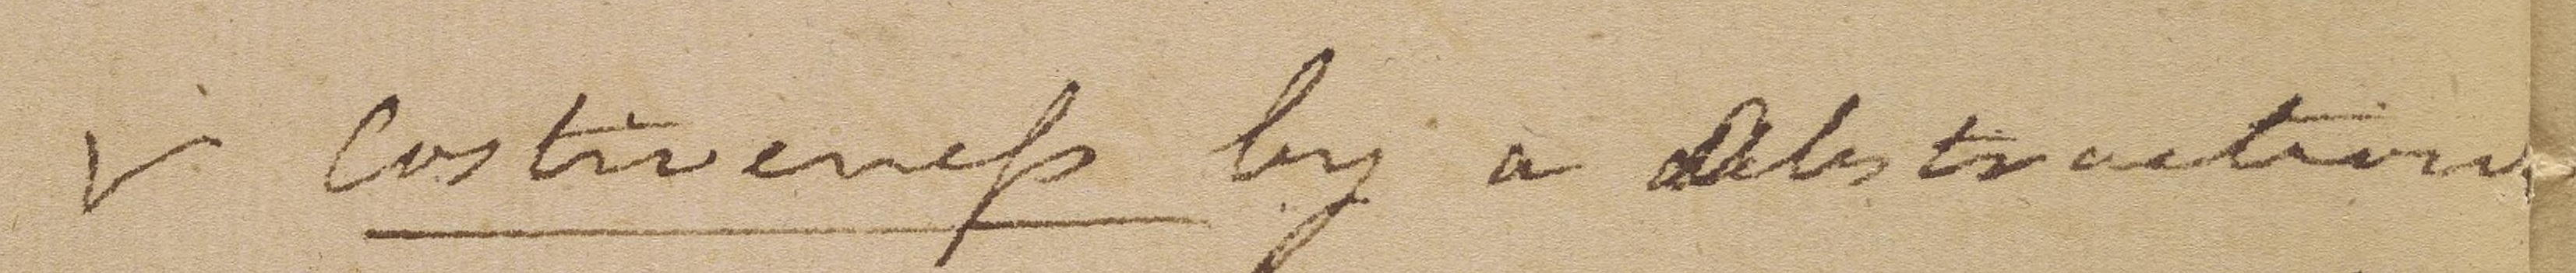V Costineness by a Abstraction
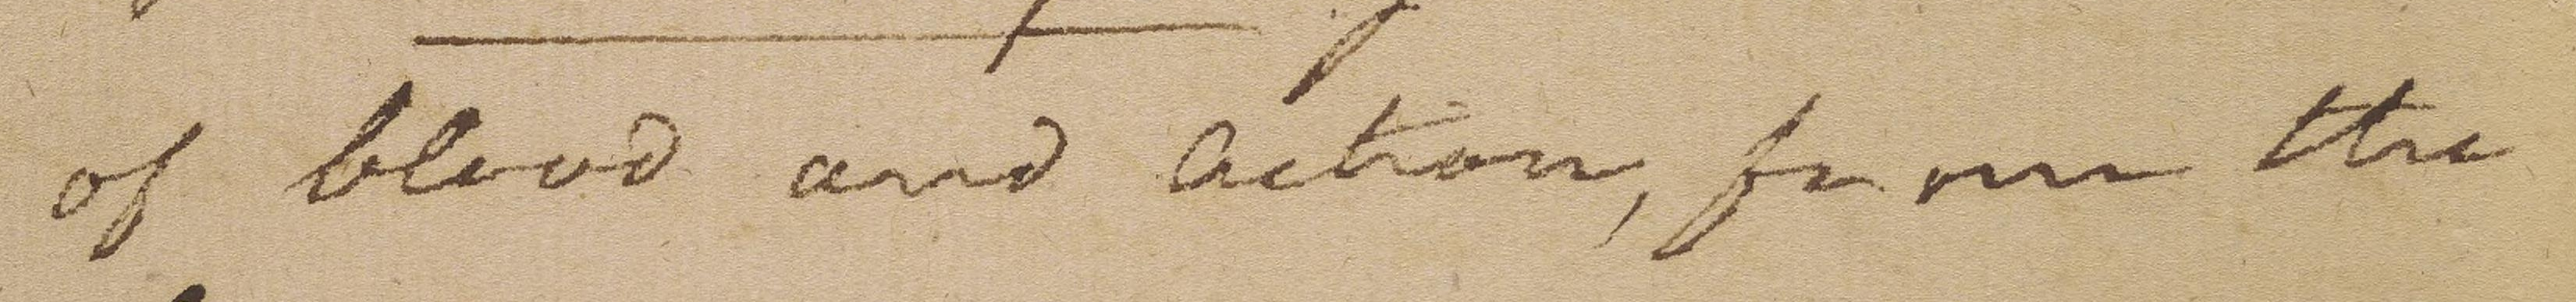of blood and action, from the
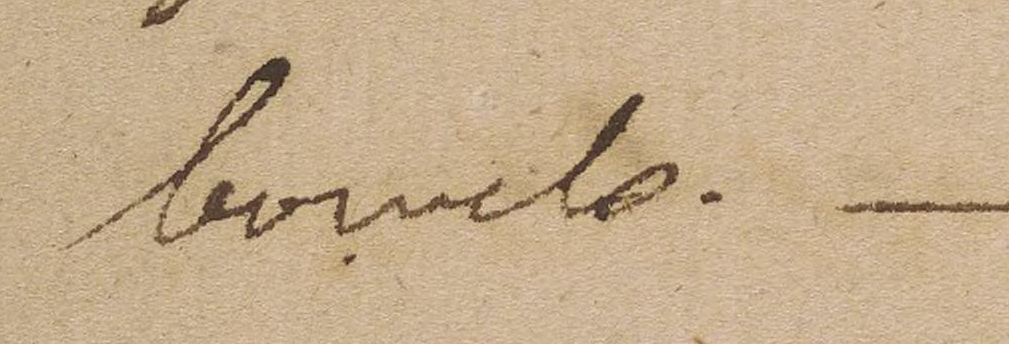bowels.
